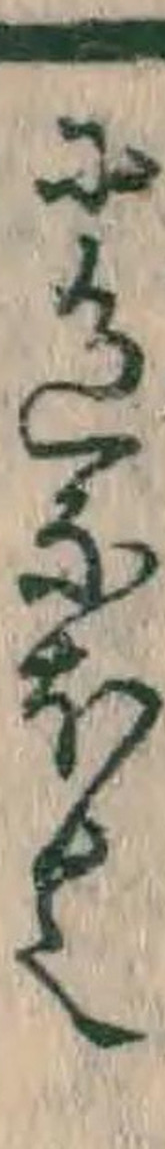に色なほる也
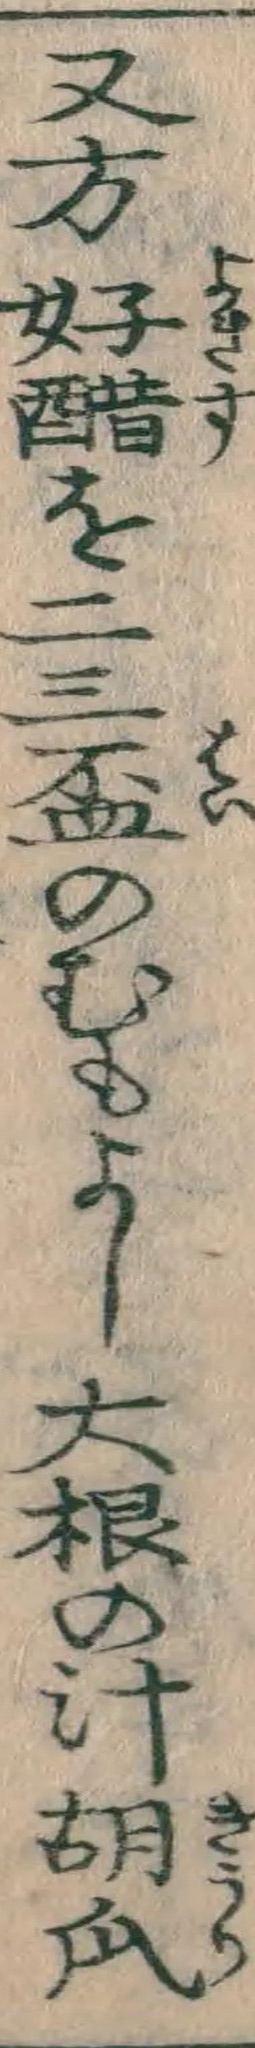又方好錯を二三盃のむもよし大根の汁胡瓜
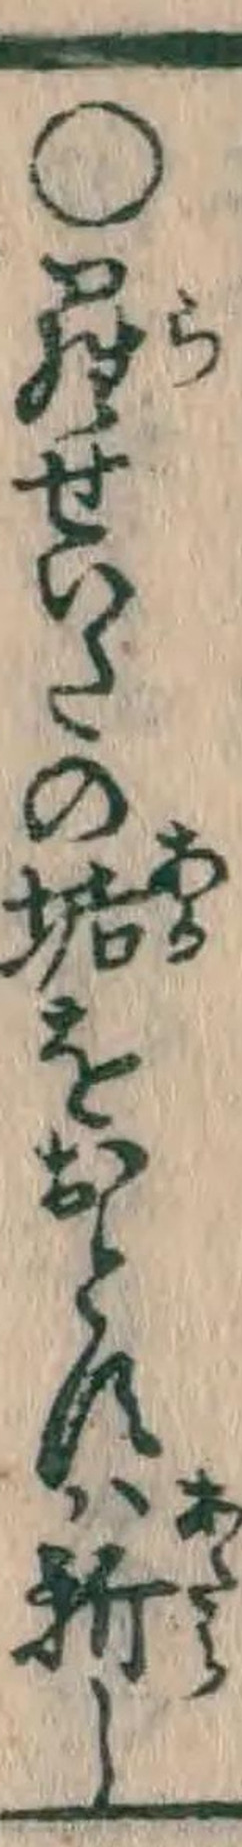○羅せいたの垢をおとすは新し
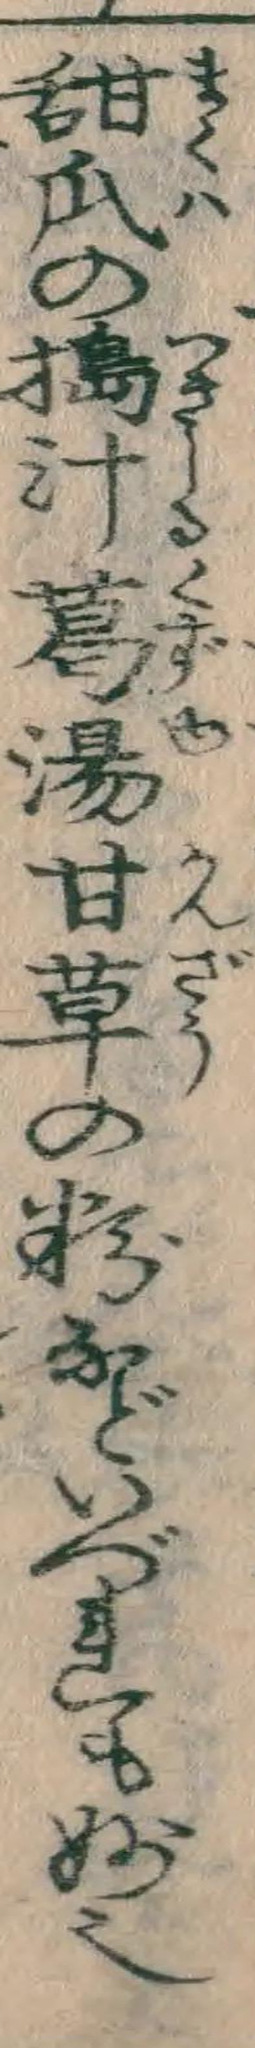甜瓜の搗汁葛湯甘草の粉などいづれも妙也
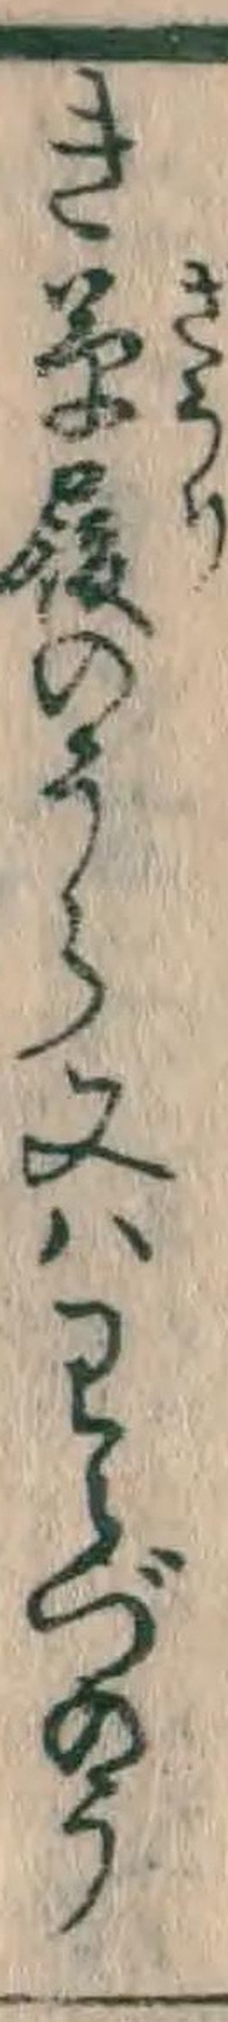き草履のうら又はわらづのう
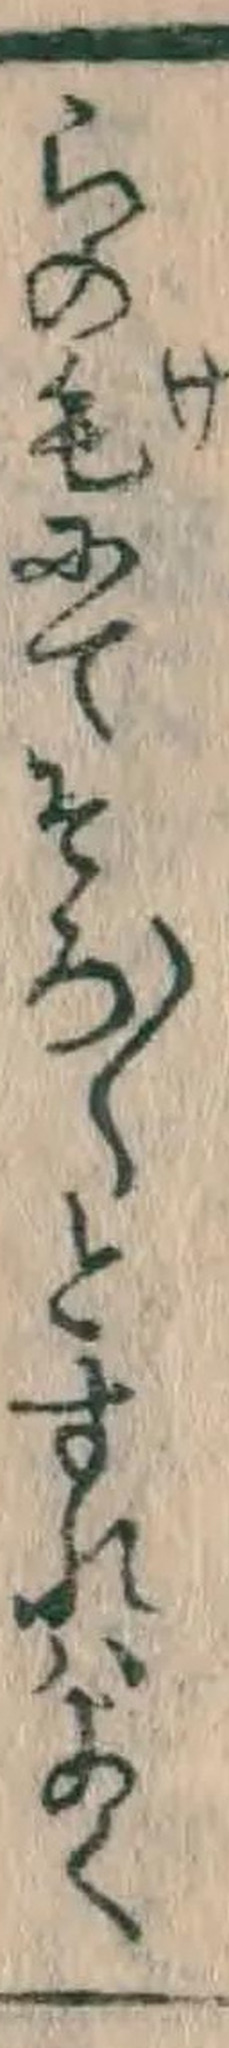らの毛にてそろ〳〵とすれはよく
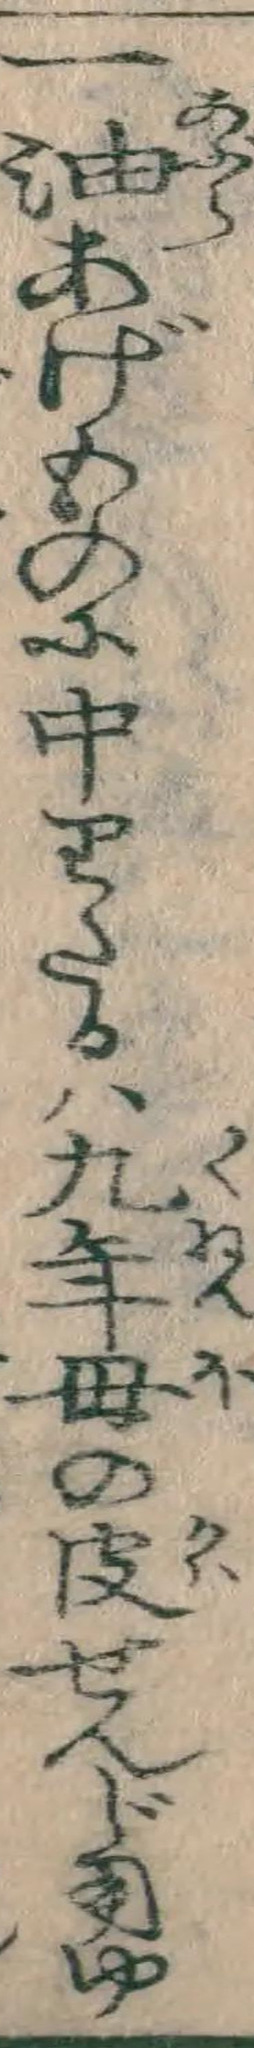一油あげものに中りたるは九年母の皮せんじ用ゆ
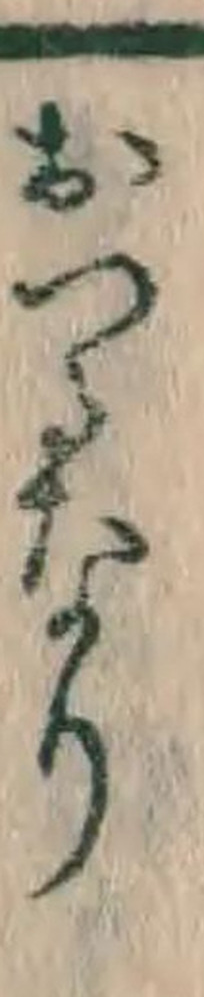おつるなり
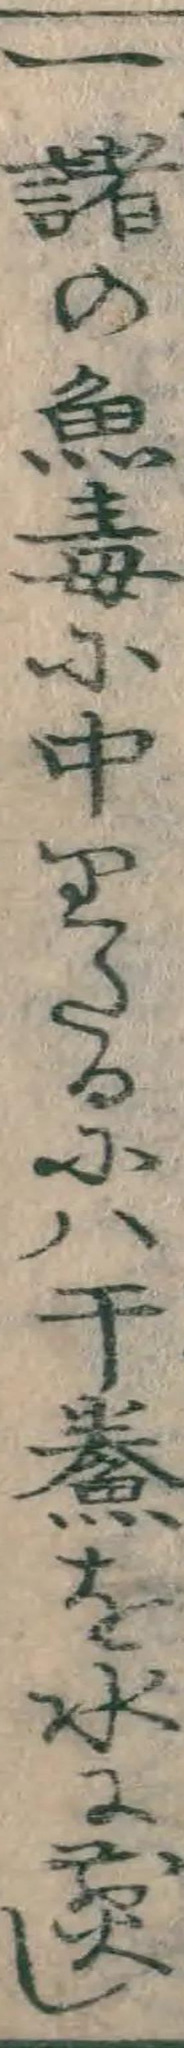一諸の魚毒に中りたるには干鮝を水に煎し
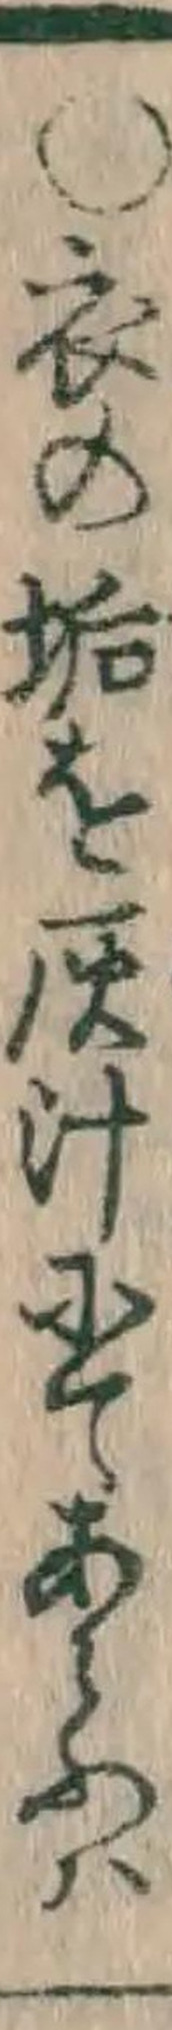○衣の垢を灰汁にてあらふは
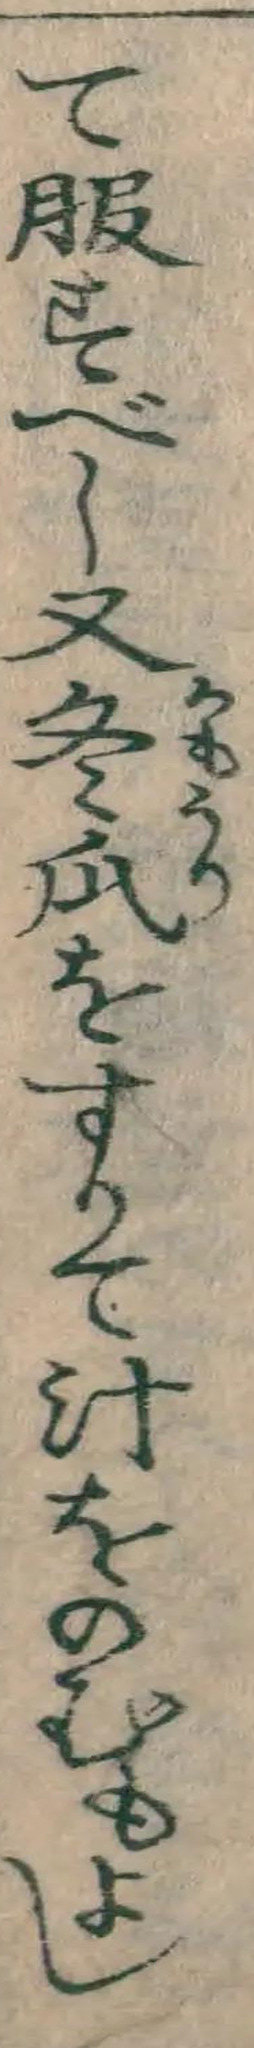て服すべし又冬瓜をすりて汁をのむもよし

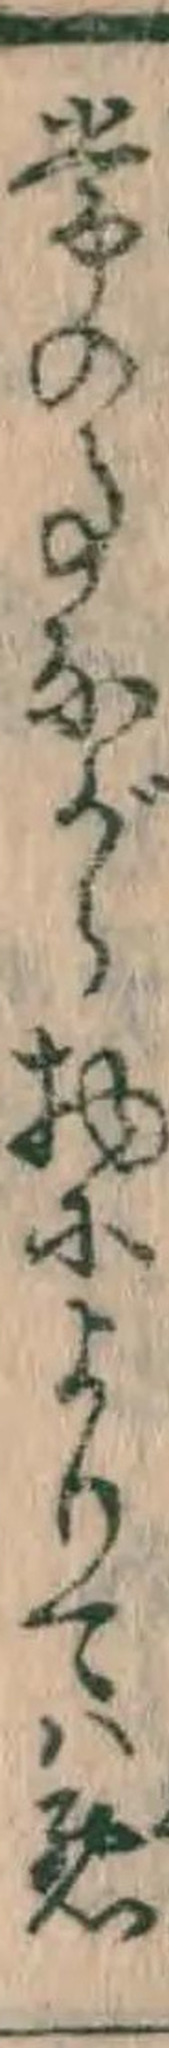常の事ながら物によりては悪
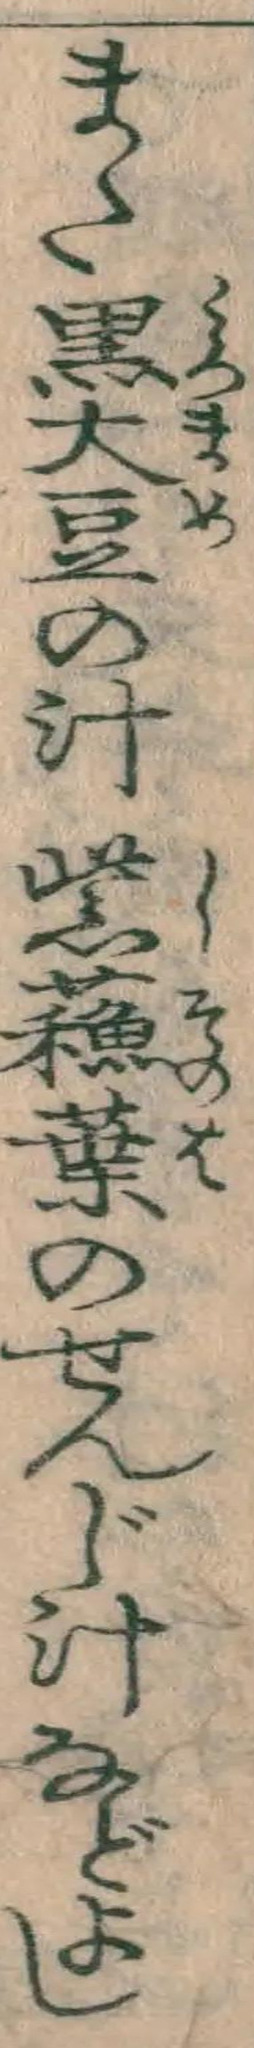また黒大豆の汁紫蘇葉のせんじ汁などよし
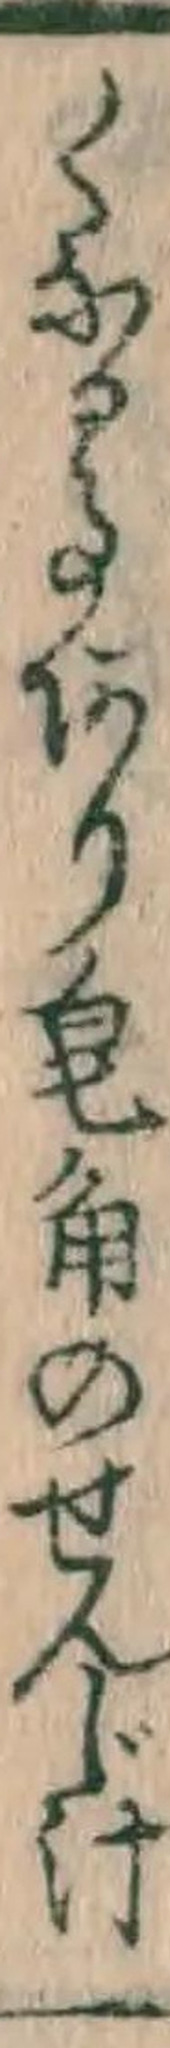くなる事あり皂角のせんじ汁
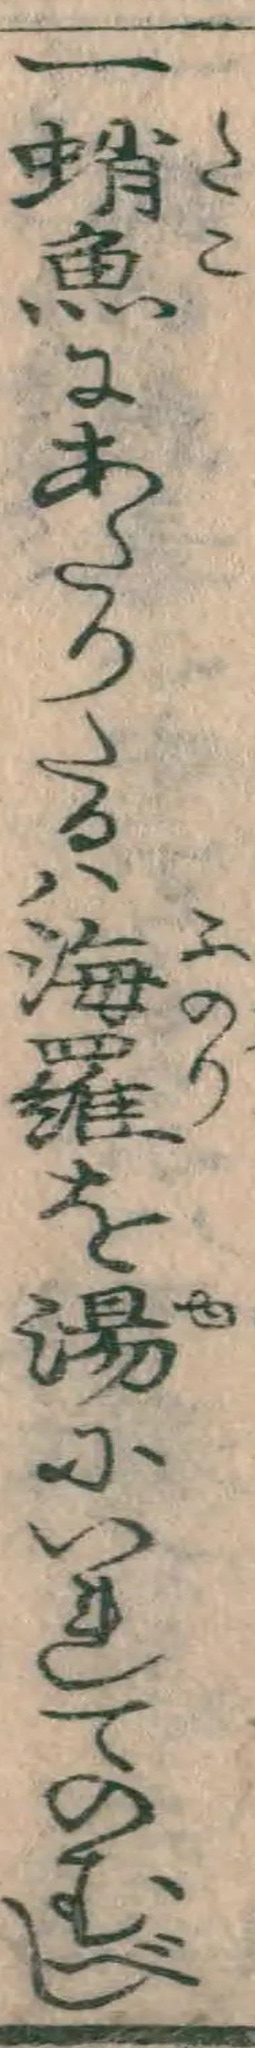一蛸魚にあたりたるは海羅を湯にいれてのむべし
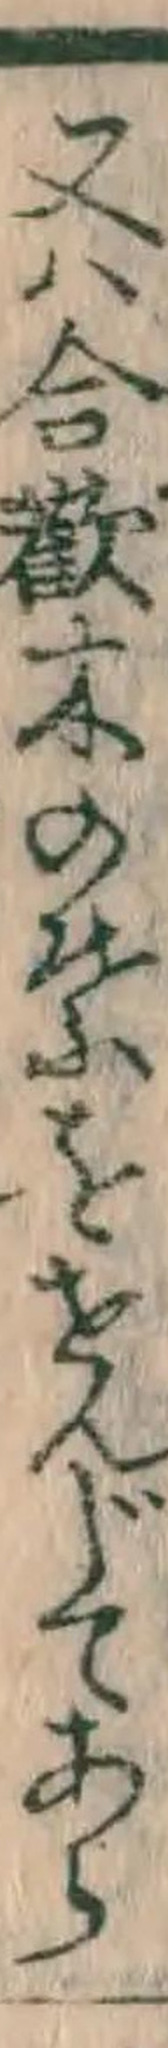又は合歓木の葉をせんじてあら
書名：広益秘事大全 3巻. [3]
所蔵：国立国会図書館 National Diet Library, JAPAN
